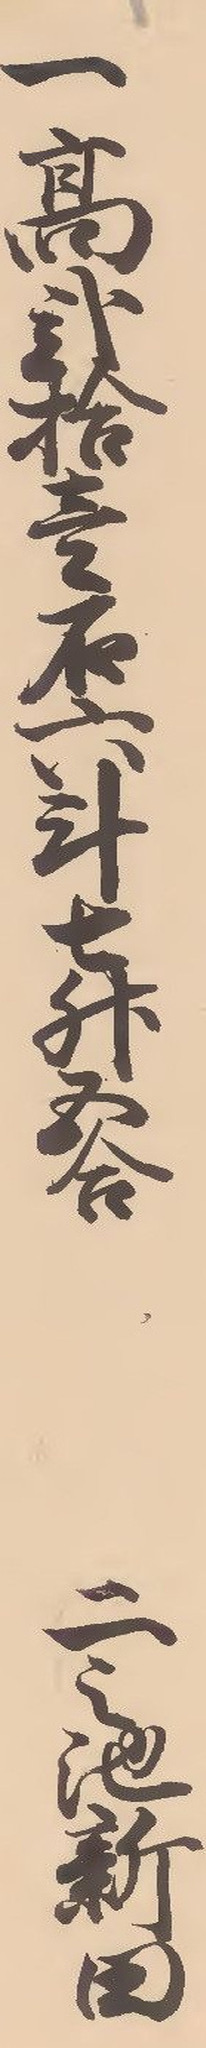一高弐拾壱石六斗七升五合二之池新田

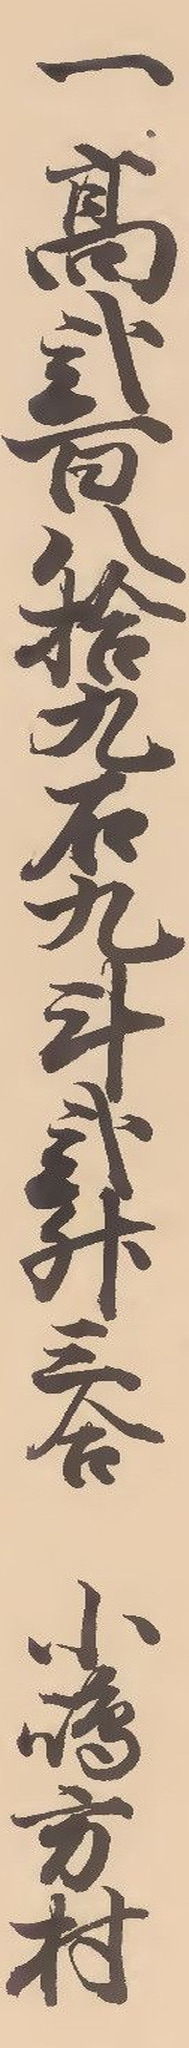一高弐百八拾九石九斗弐升三合小島方村
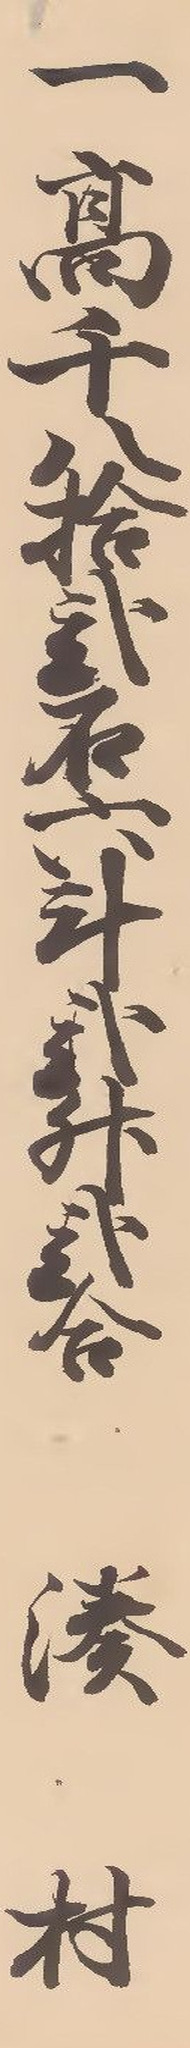一高千八拾弐石六斗弐升弐合湊村
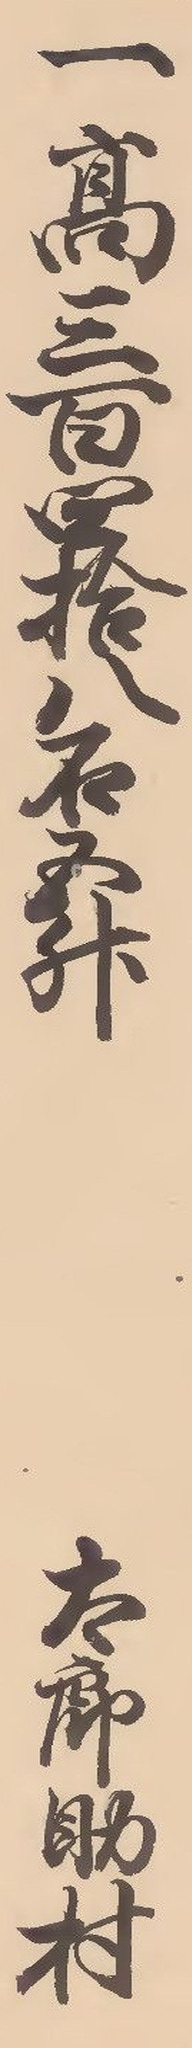一高三百四拾八石五升太郎助村
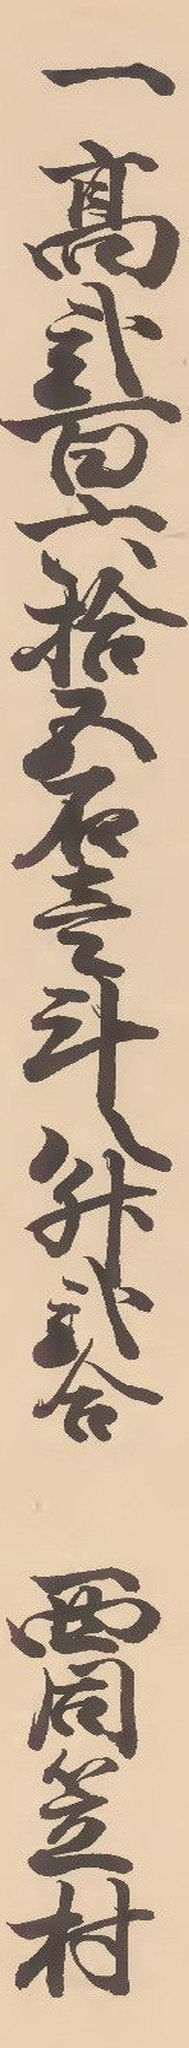一高弐百六拾五石壱斗八升弐合西同笠村
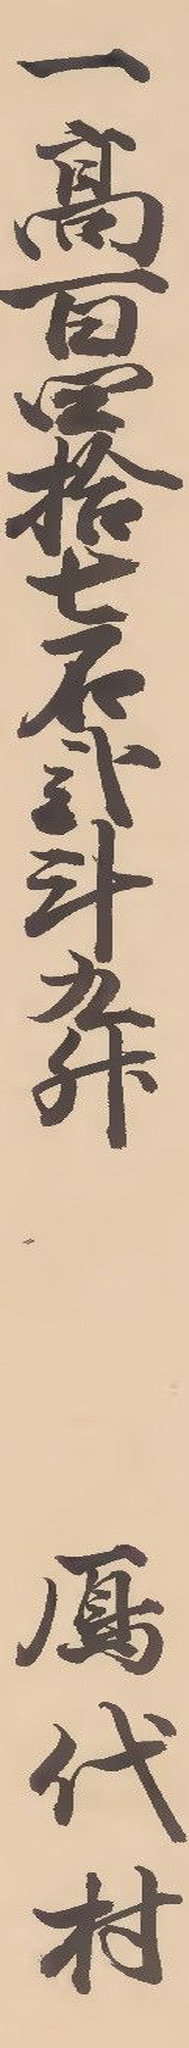一高百四拾七石弐斗九升雁代村
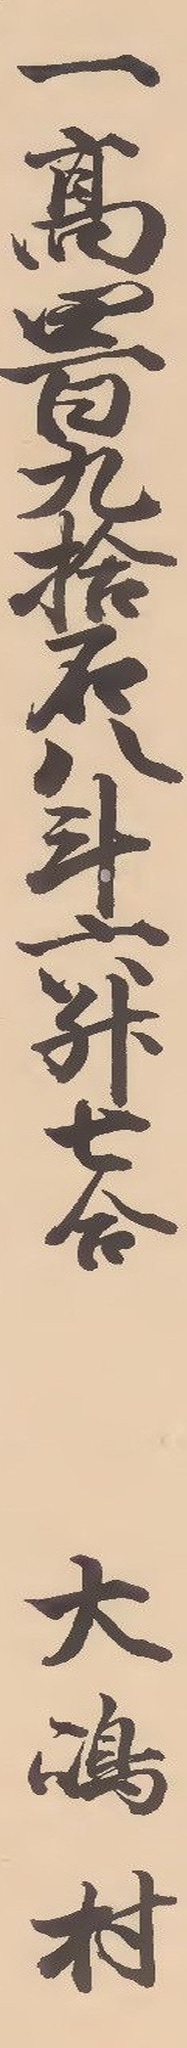一高四百九拾石八斗六升七合大島村
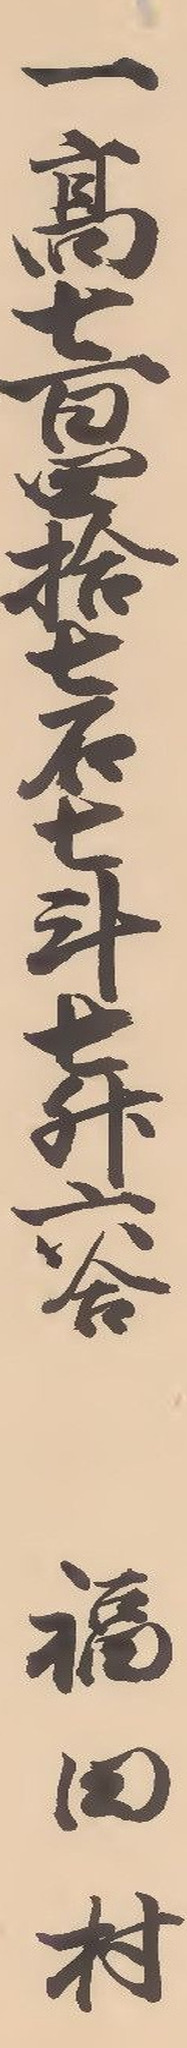一高七百四拾七石七斗七升六合福田村

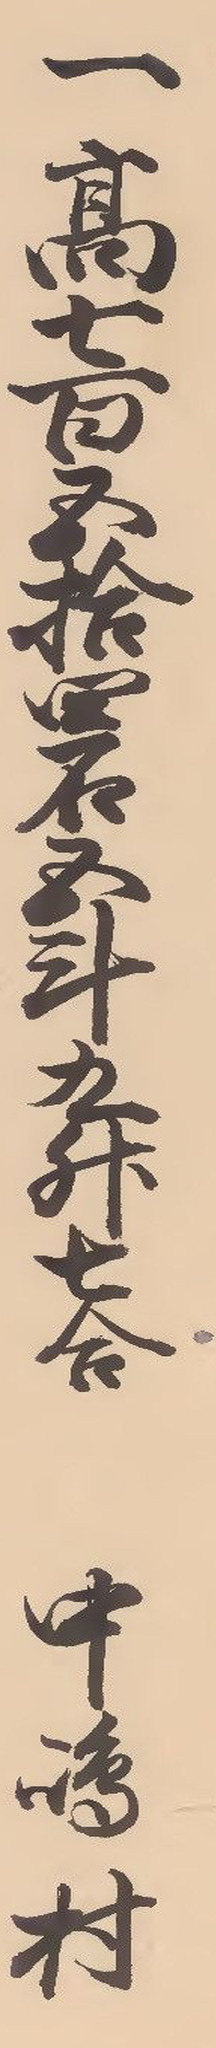一高七百五拾四石五斗九升七合中島村
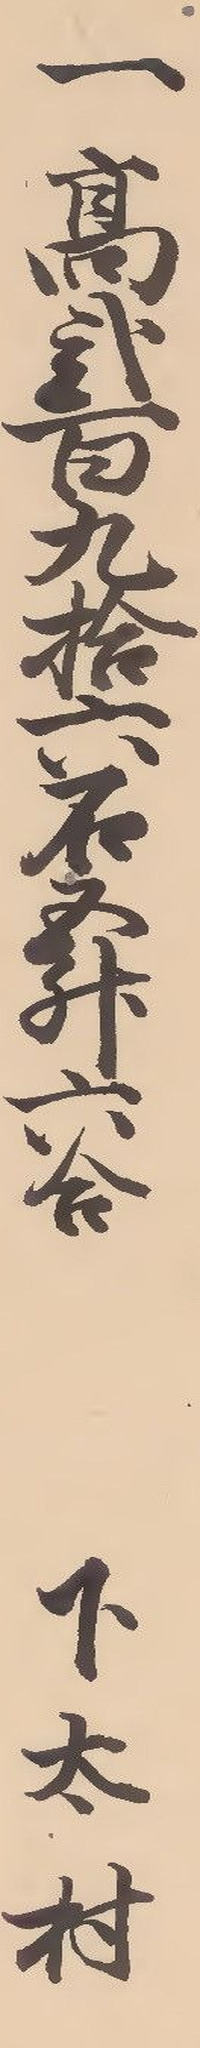一高弐百九拾六石五升六合下太村
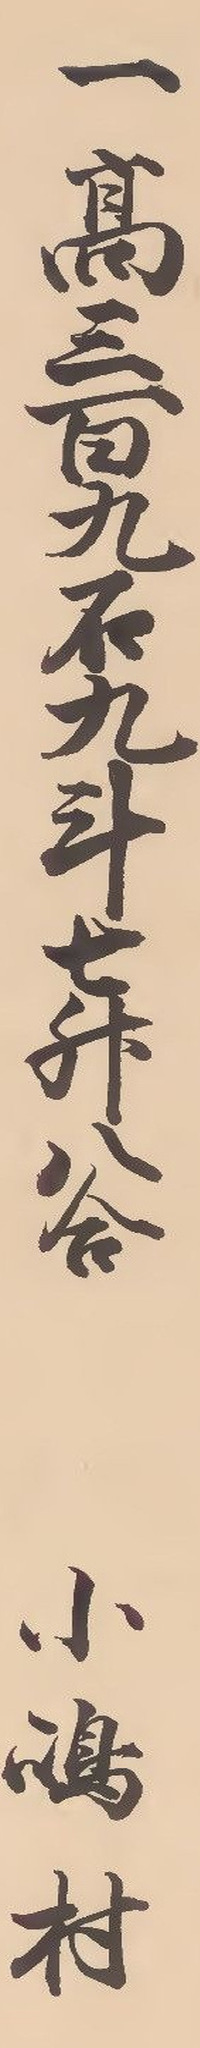一高三百九石九斗七升八合小島村
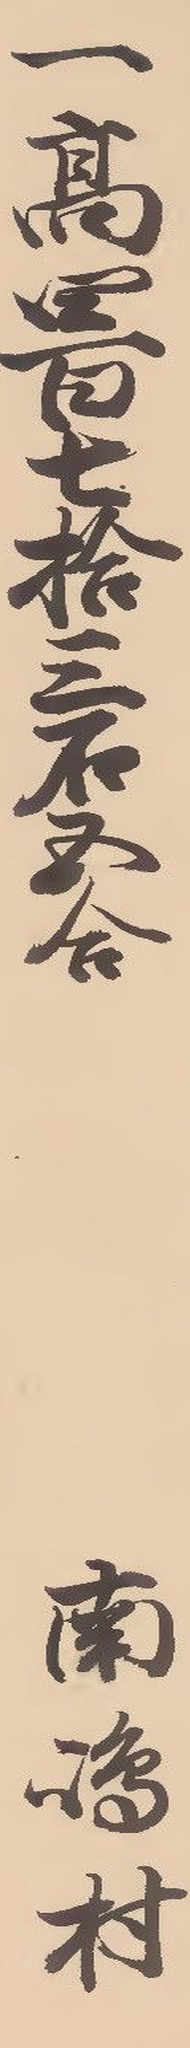一高四百七拾三石五合南島村
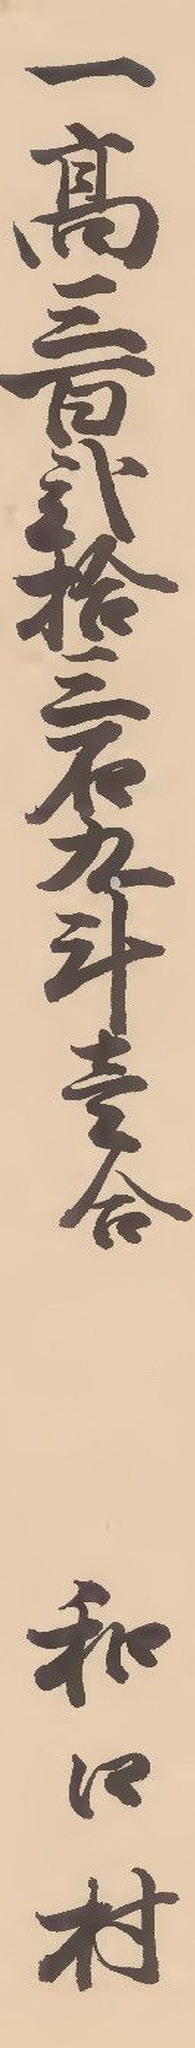一高三百弐拾三石九斗壱合和口村
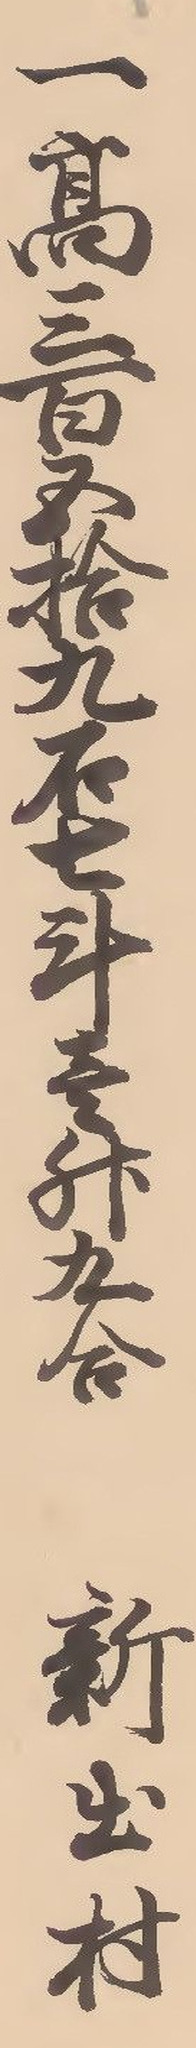一高三百五拾九石七斗壱升九合新出村
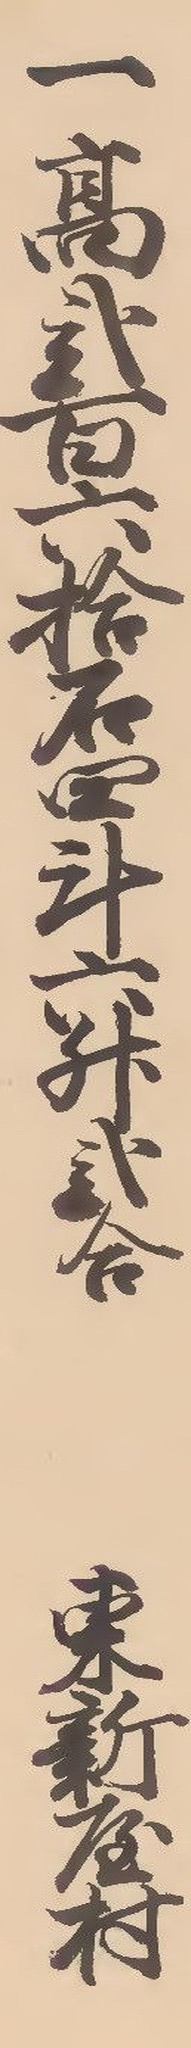一高弐百六拾石四斗六升弐合東新屋村

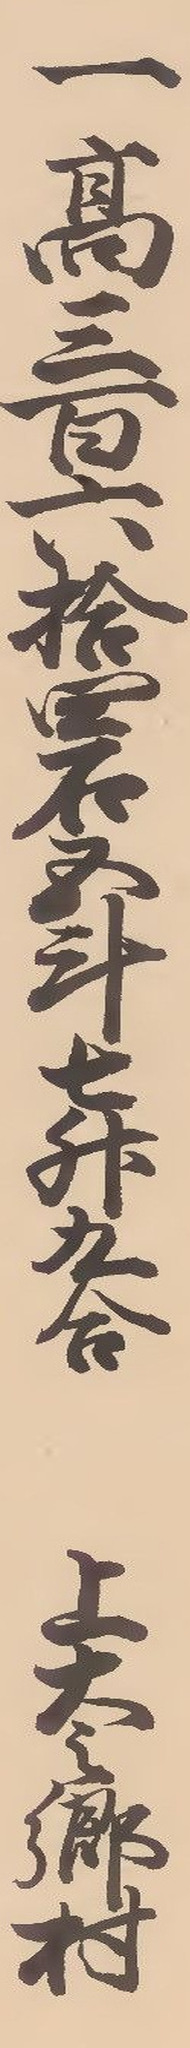一高三百六拾四石五斗七升九合上大之郷村
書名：遠江国郷帳
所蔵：国立公文書館 National Archives of Japan
